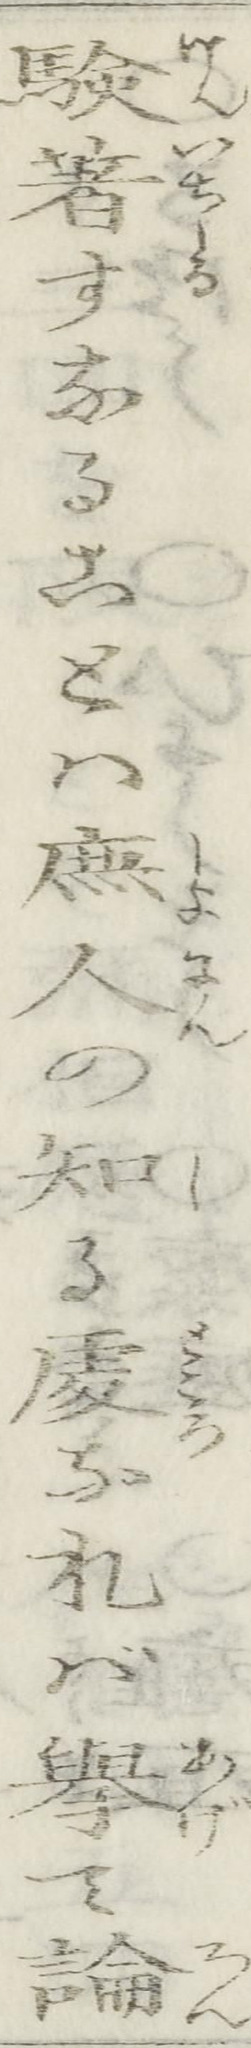験著すなることは庶人の知る処なれば挙て論
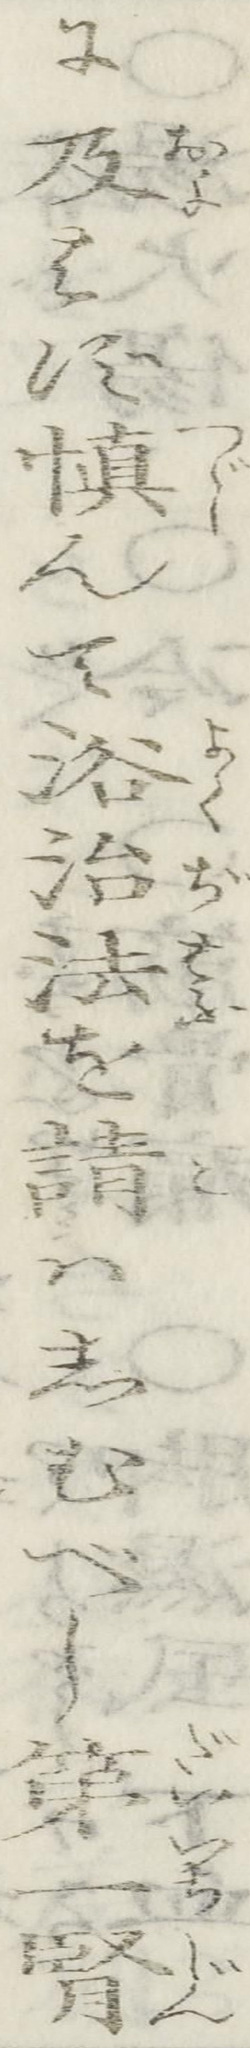に及ばず慎んで浴治法を請はしむべし第一腎
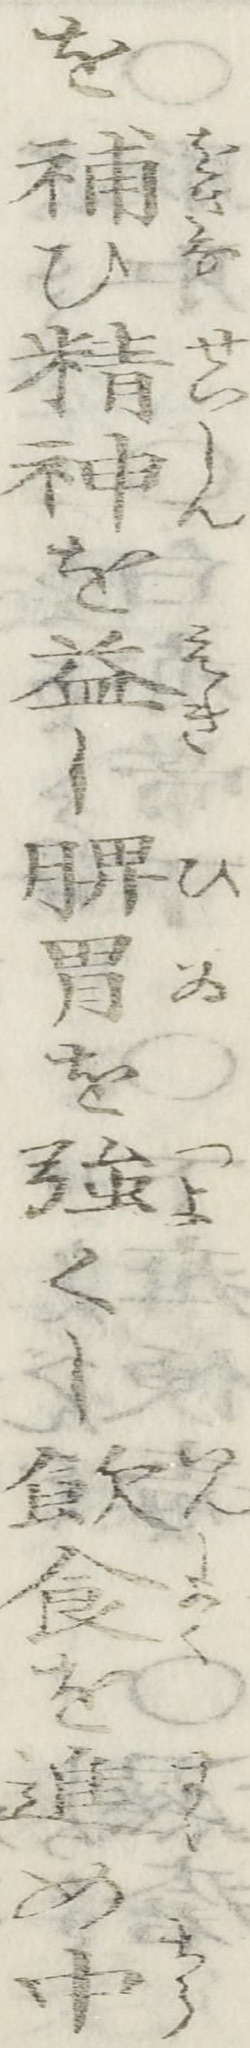を補ひ精神を益し脾胃を強くし飲食を進め中
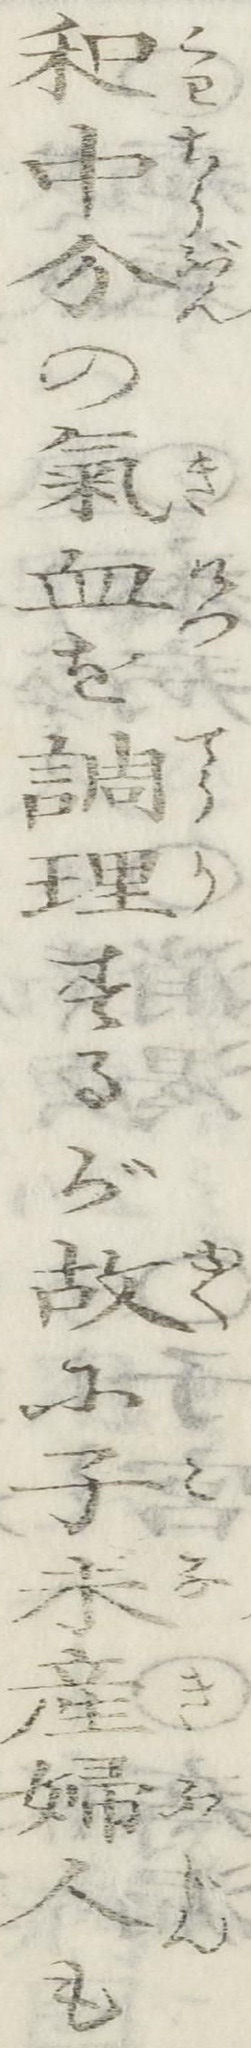和中分の気血を調理するが故に子未産婦人も
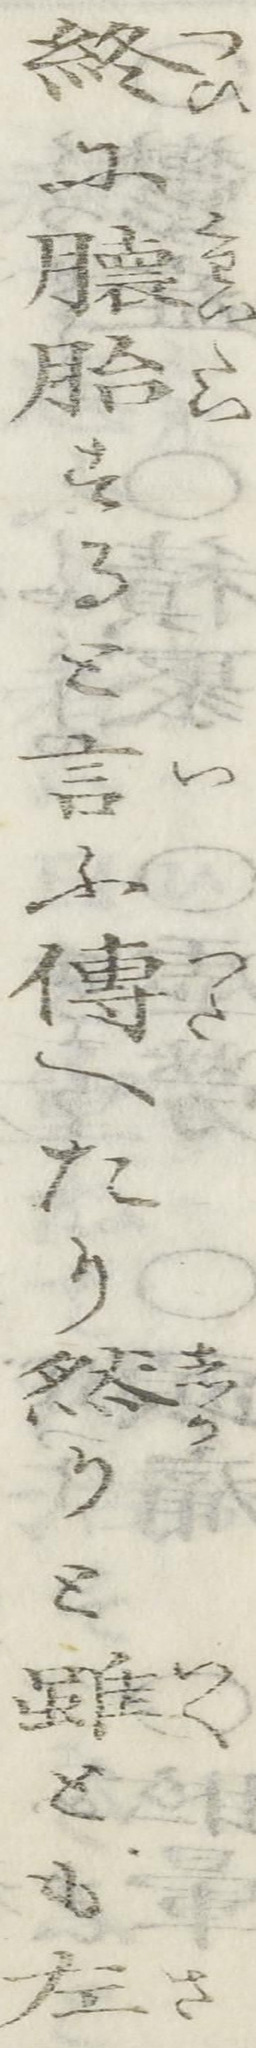終に懐胎すると言ふ伝へたり然りと雖とも左
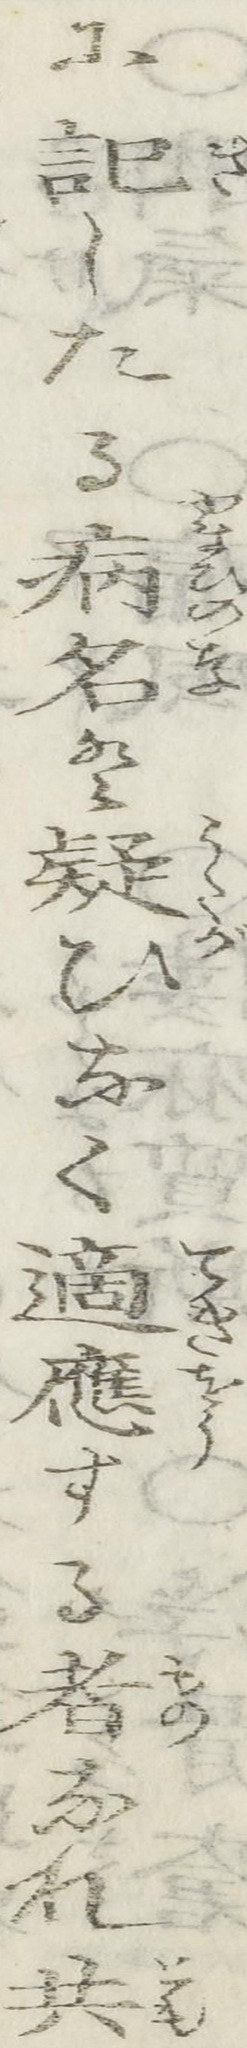に記したる病名を疑ひなく適応する者なれ共
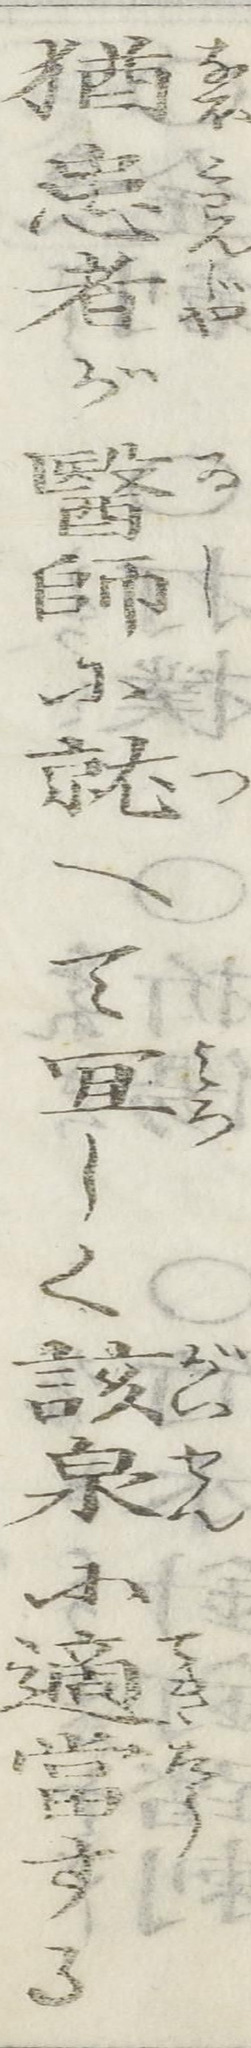猶患者が医師に就へて宜しく該泉に適当する
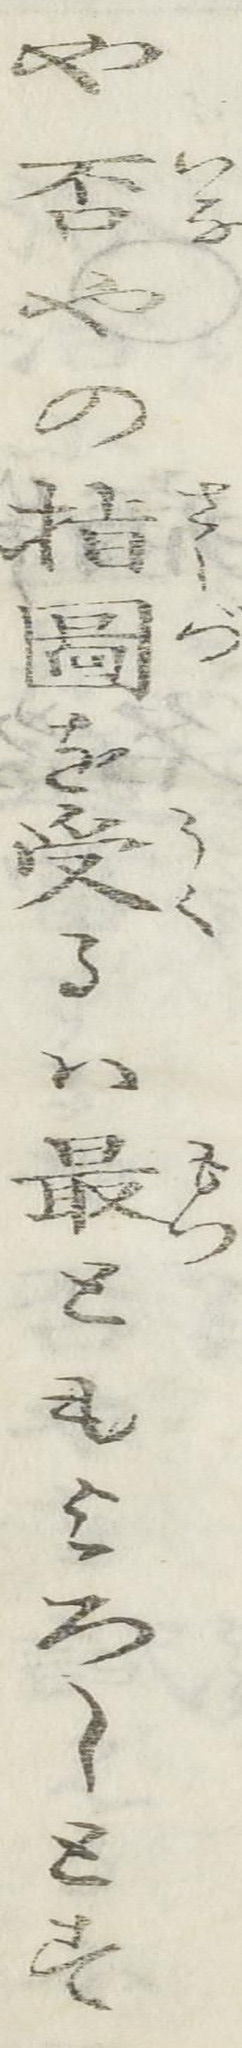や否やの指図を受るは最ともよろしとす

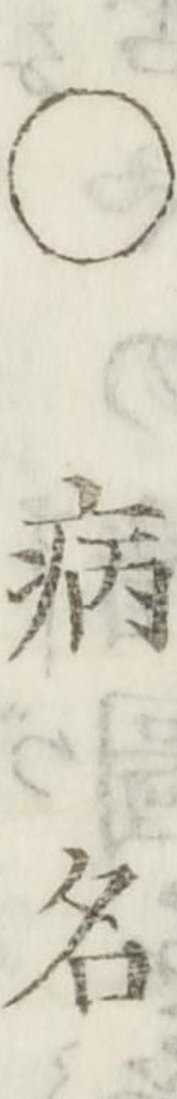〇病名
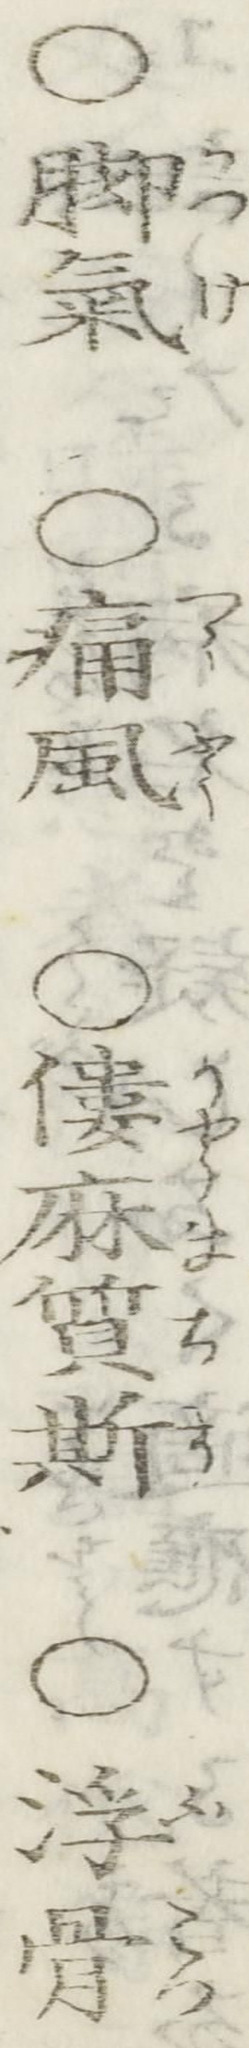〇脚気〇痛風〇僂麻質斯〇浮骨瘡
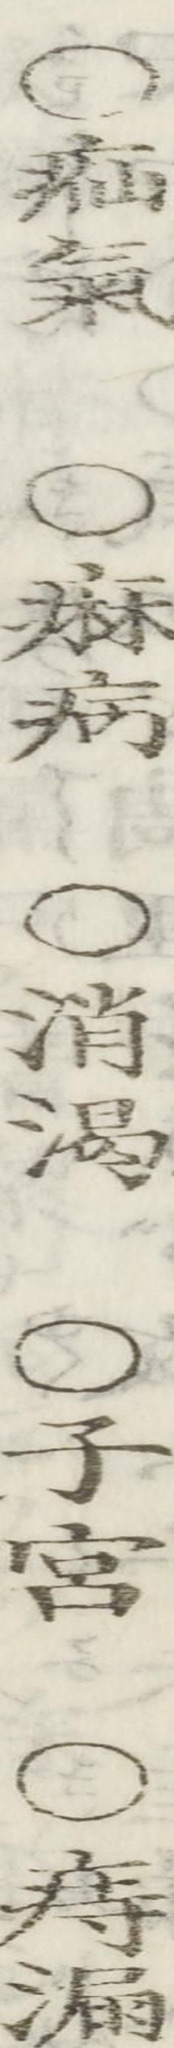〇疝気〇痳病〇消渇〇子宮〇痔漏
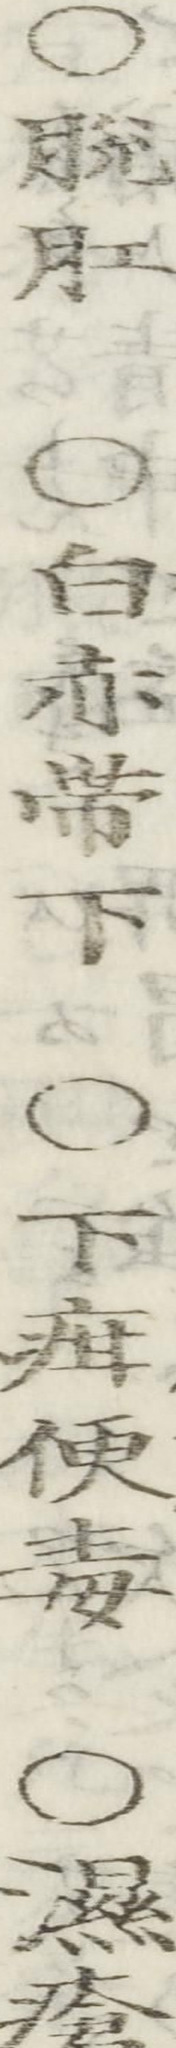〇脱肛〇白赤帯下〇下疳便毒〇湿瘡
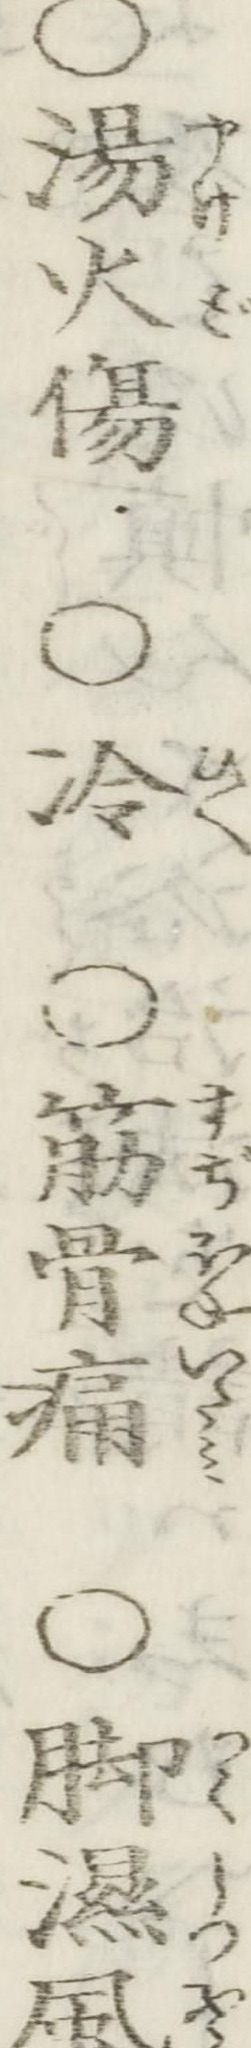〇湯火傷〇冷〇筋骨痛〇脚湿風下血
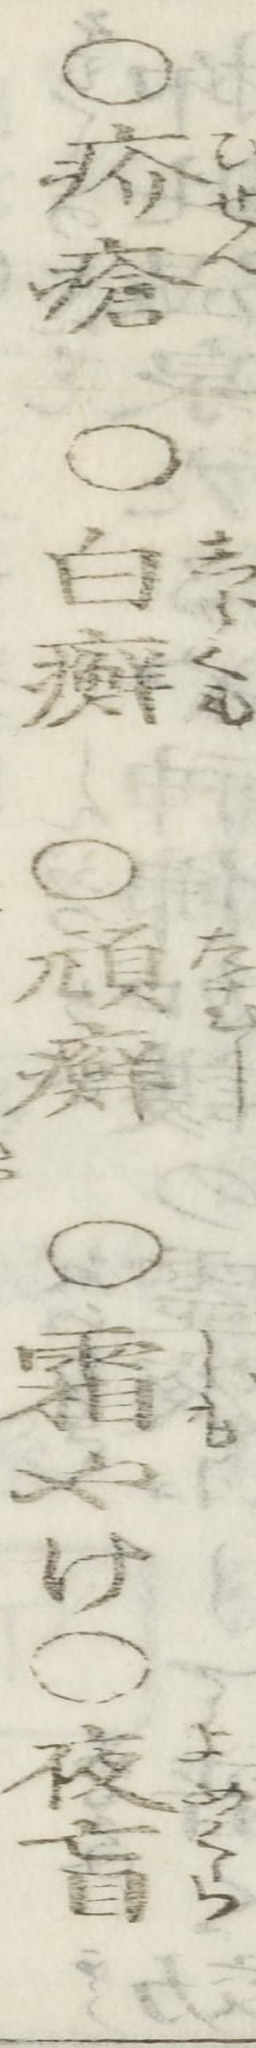〇疥瘡〇白癬〇頑癬〇霜やけ〇夜盲
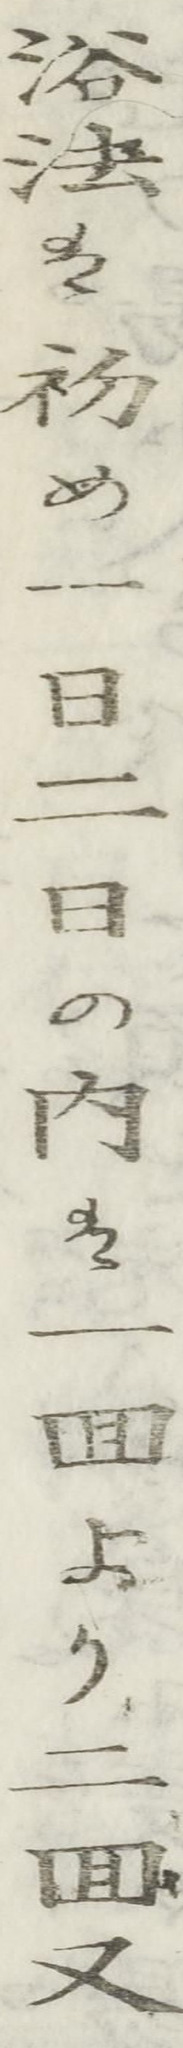浴法を初め一日二日の内は一回より二回又
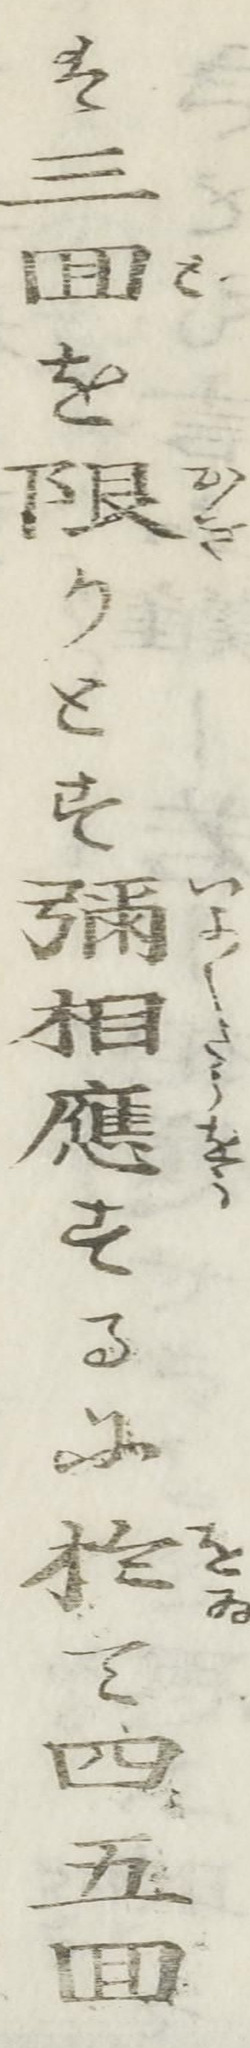は三回を限りとす弥相応するに於て四五回
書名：鎌先温泉由來記
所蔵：東京大学地震研究所図書室 Earthquake Research Institute Library, The University of Tokyo, JAPAN
